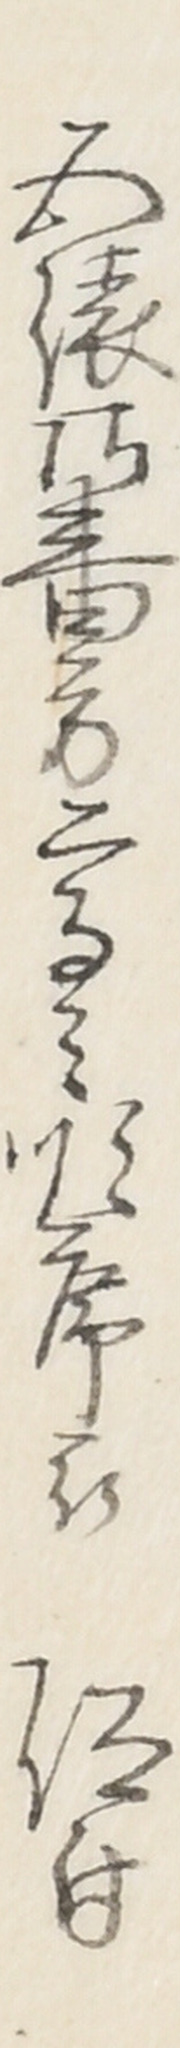五俵御番方高之順席被仰付
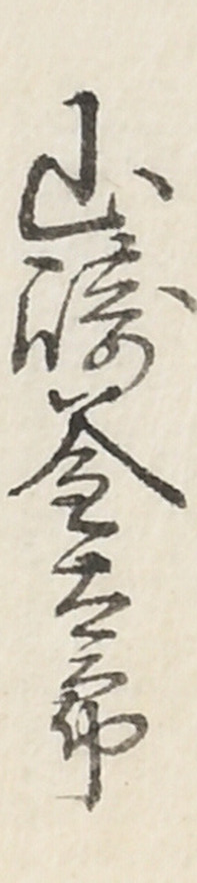山崎釜太郎
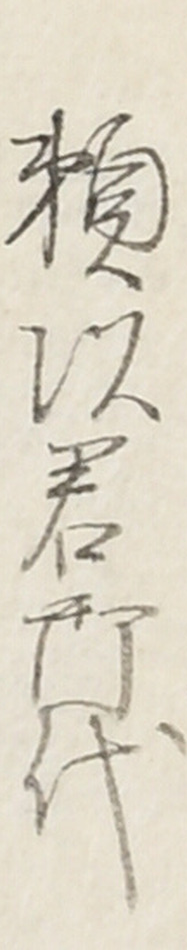頼以君御代
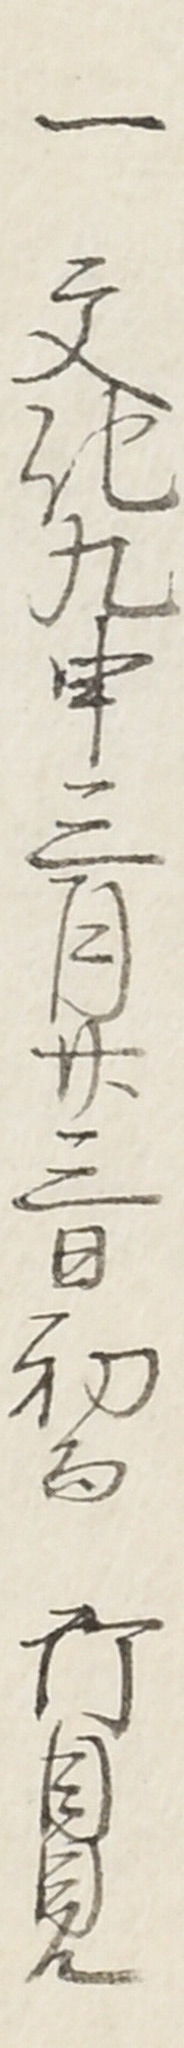一文化九申三月廿三日初而御目見
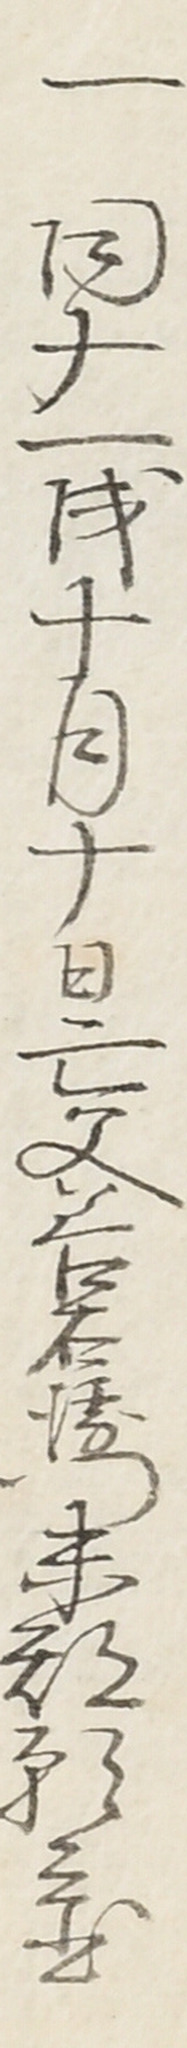一同十一戌十月十日亡父善右衛門末期願置
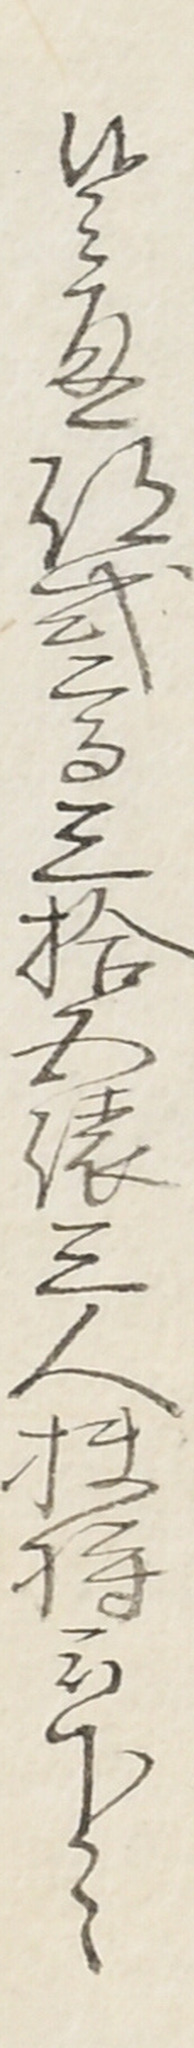候之通跡式高三拾五俵三人扶持被下之
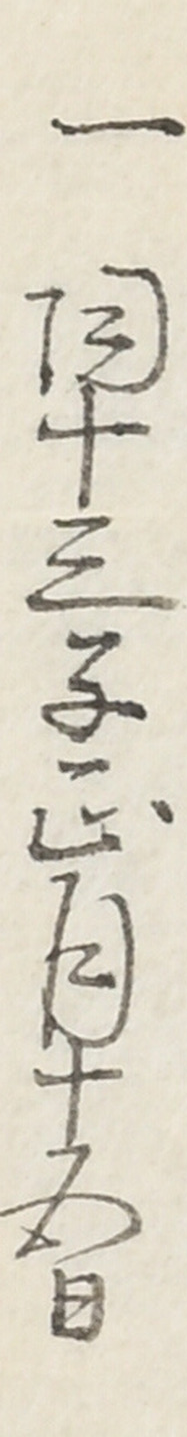一同十三子正月十五日
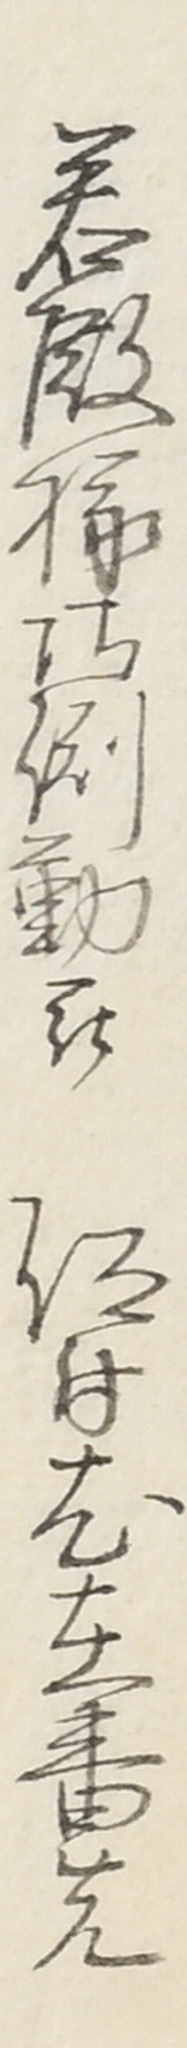若殿様御側勤被仰付尤在番先
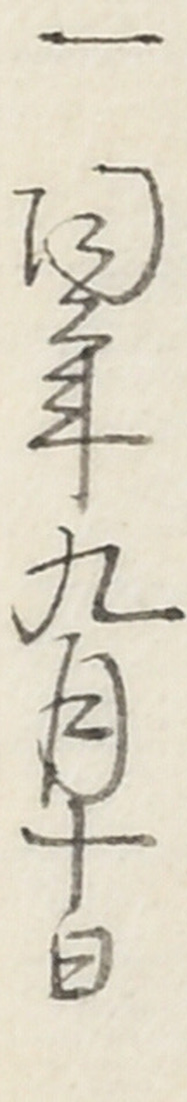一同年九月十日

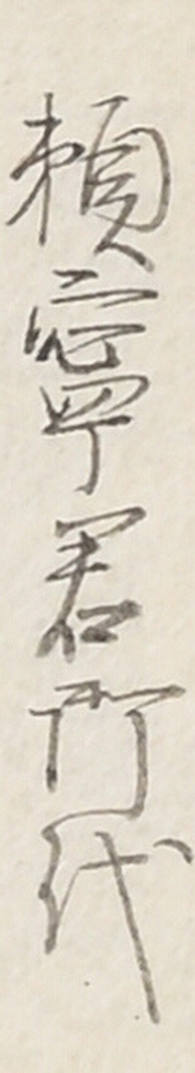頼寧君御代
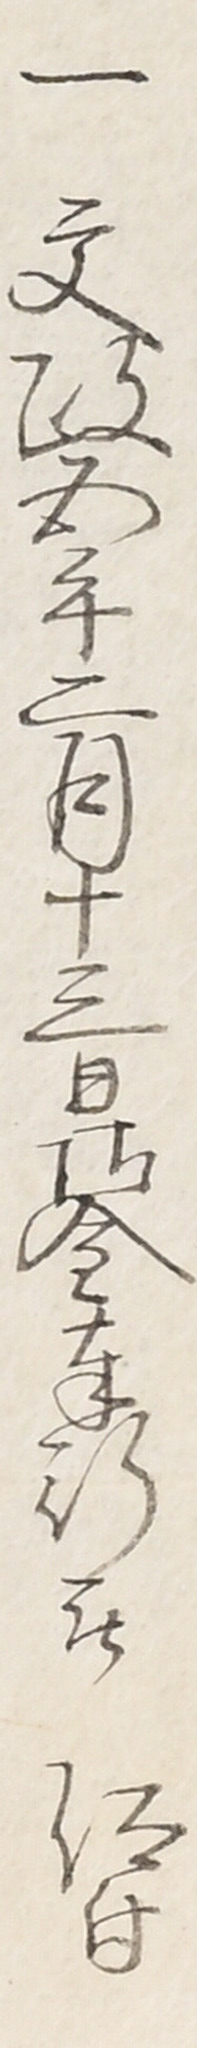一文政五午二月十三日御金奉行被仰付
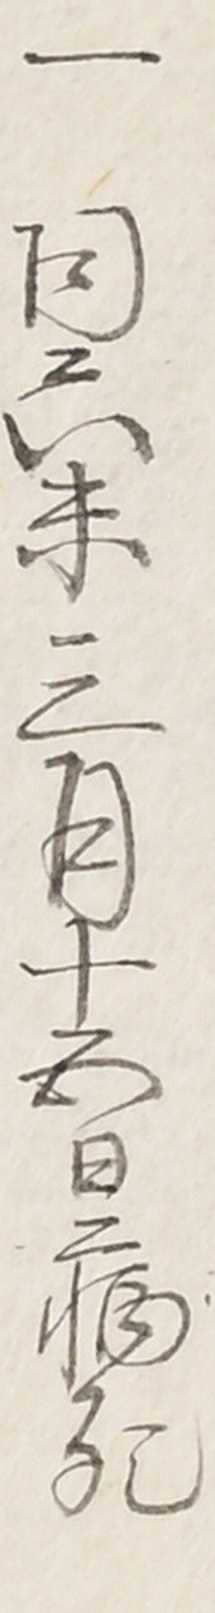一同六未三月十五日病死
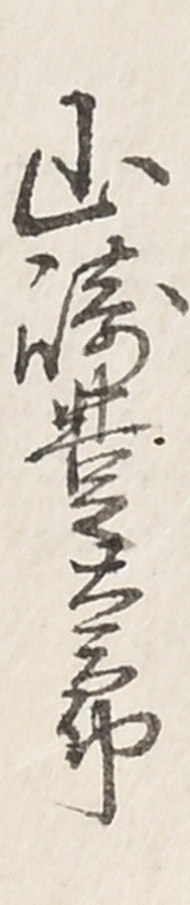山崎豊太郎
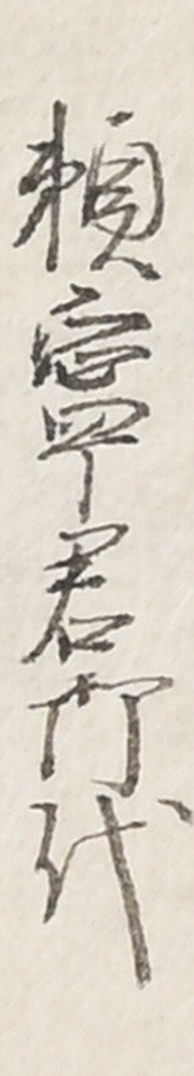頼寧君御代
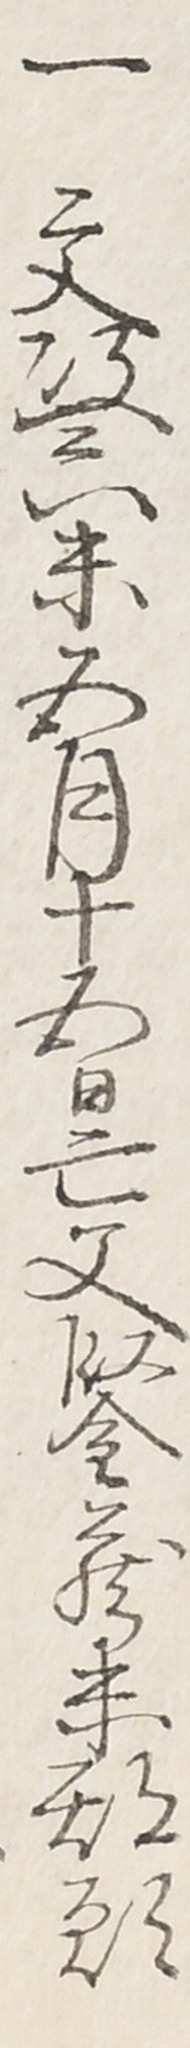一文政六未五月十五日亡父鋻蔵末期願
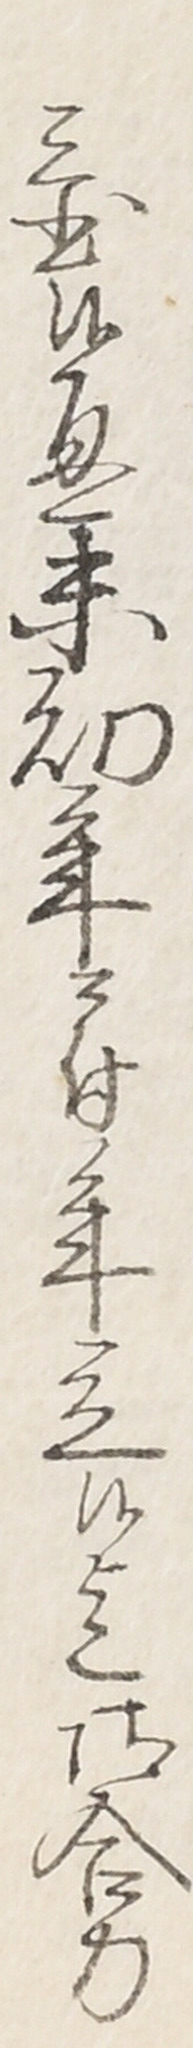置候通未幼年ニ付年立候迄御合力
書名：給人諸士勤仕録（七）
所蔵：伊那市立高遠町図書館・合同会社AMANE
